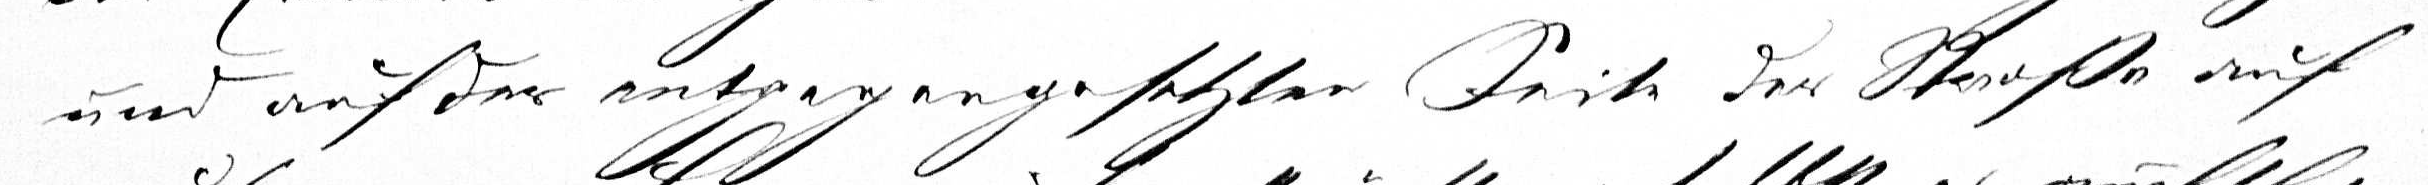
und auf der entgegengesetzten Seite der Straße auf
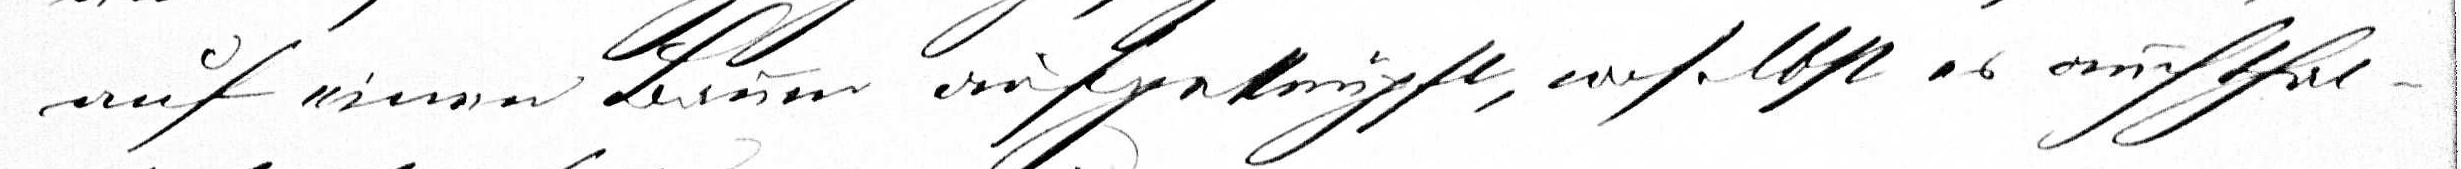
einen Baum aufgeknüpft, woselbst es auch tath¬
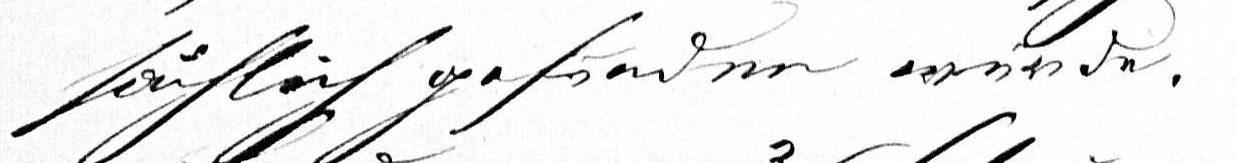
sächlich gefunden wurde.
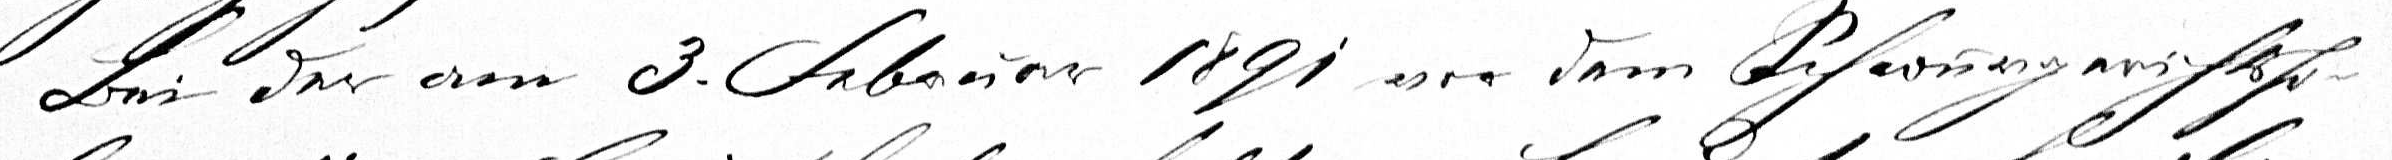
Bei der am 3. February 1891 vor dem schwurgerichtsh¬
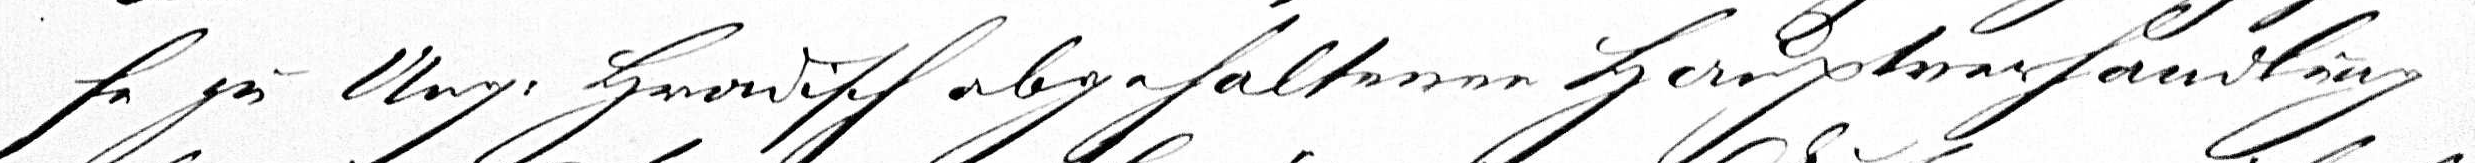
of zu Ung. Hradisch abgehaltener Hauptverhandlung
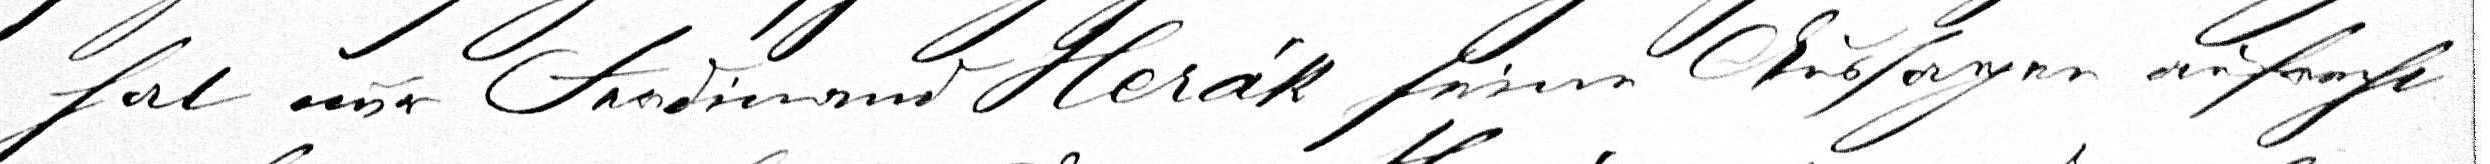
hat nur Ferdinand Herák seine Aussagen aufrecht¬
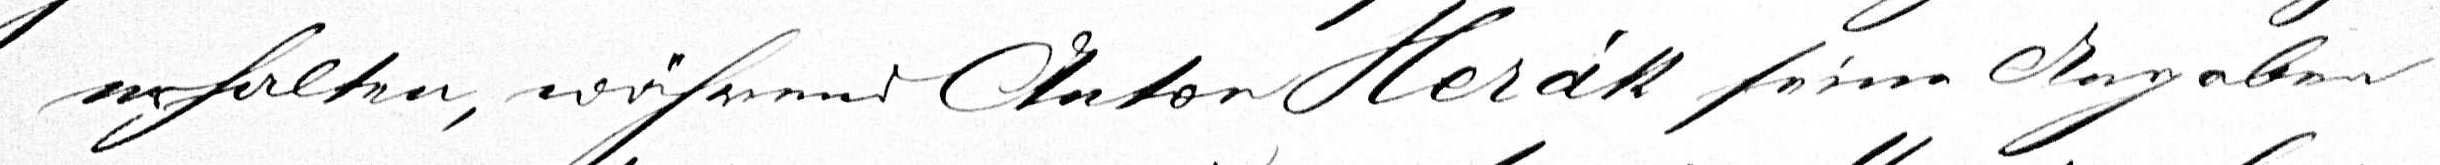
erhalten, während Anton Herák seine Angaben
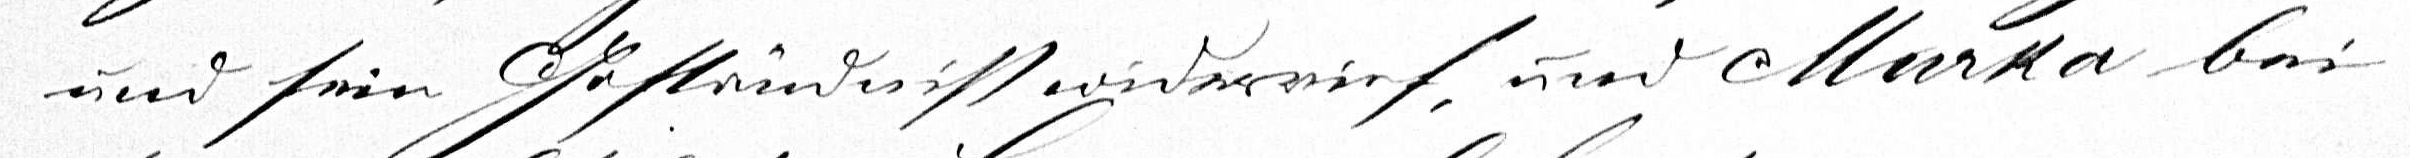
und sein Geständniß widerrief, und Murka bei
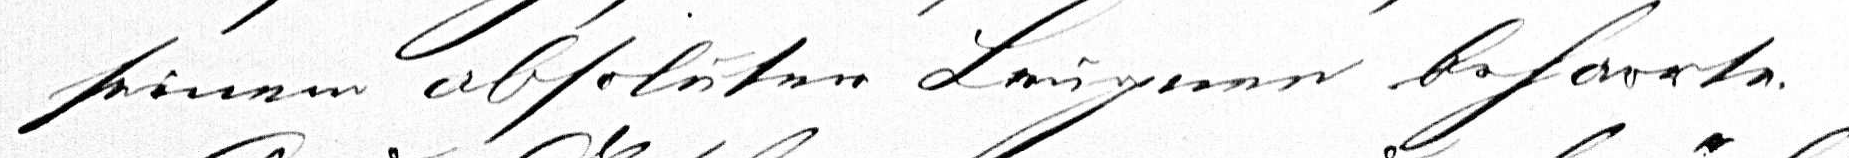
seinem aboluten Läugnen beharrte.
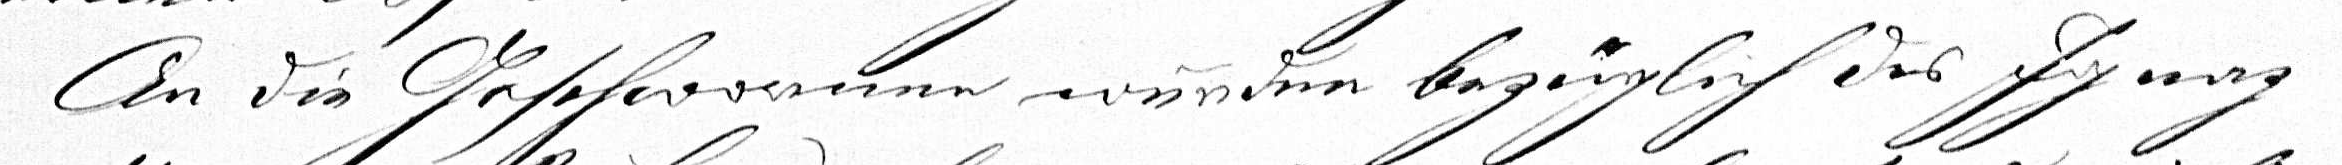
An die Geschworenen wurden bezüglich des Ignaz
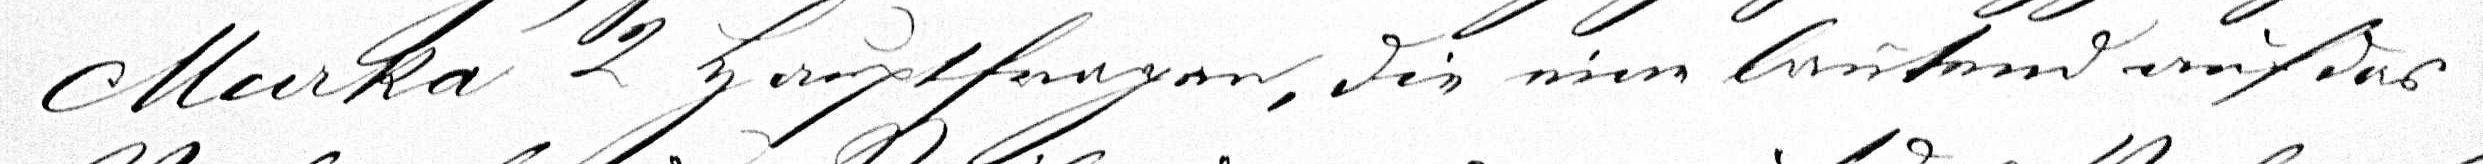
Murka 2 Hauptfragen, die eine lautend auf das
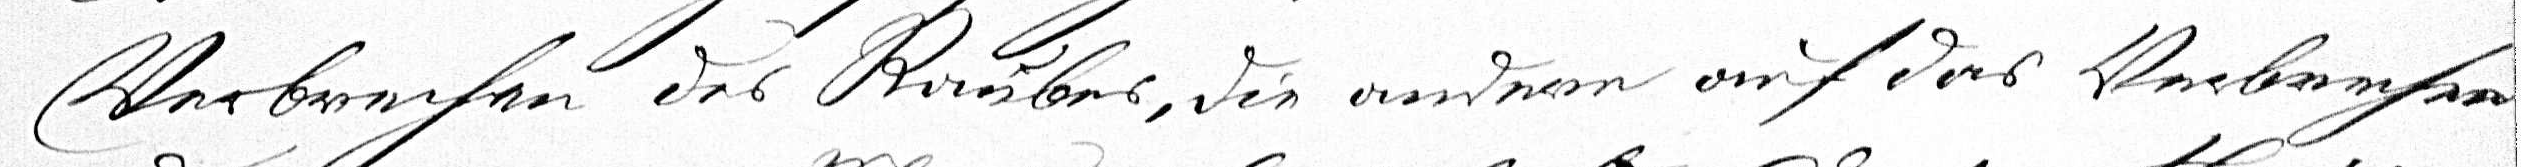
Verbrechen des Rabues, die andere auf das Verbrechen
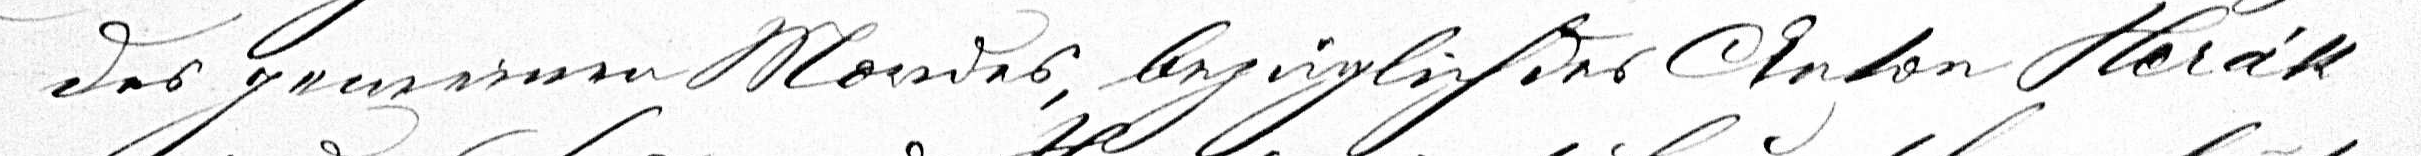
des gemeinen Mordes, bezüglich des Anton Herák
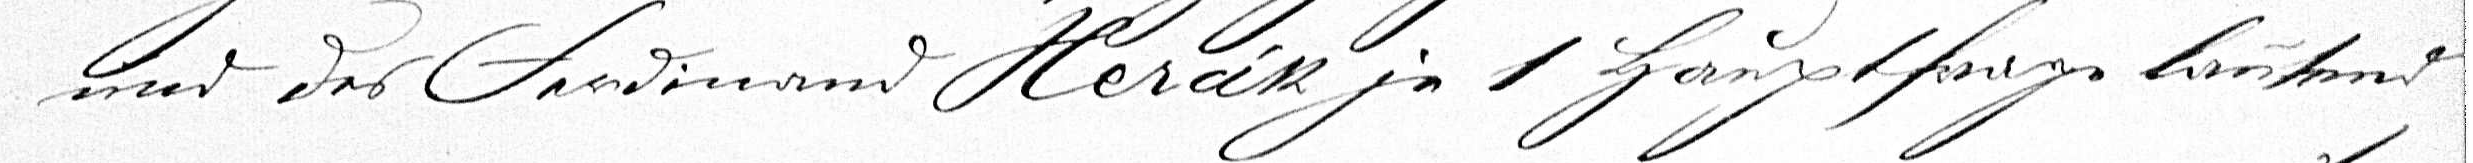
und des Ferdinand Herák je 1 Hauptfrage läutend
